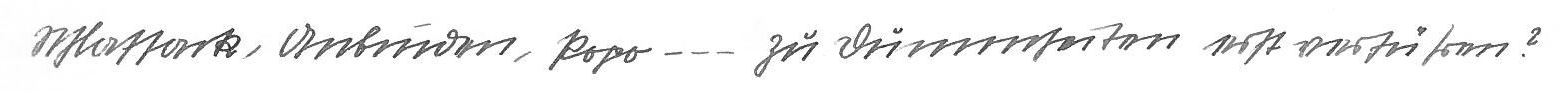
Schlafsack, Anbinden, Popo – – – zu Dummheiten erst verführen?
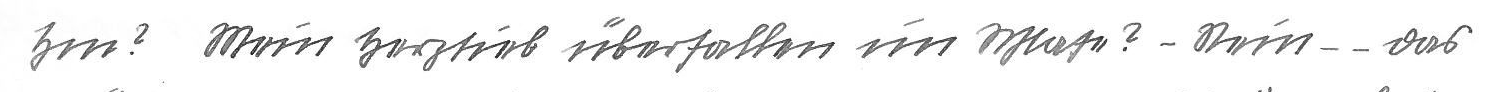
Hm? Mein Herzlieb überfallen im Schlafe? – Nein – – das
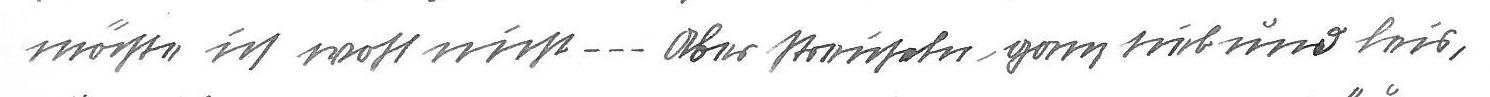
möchte ich wohl nicht – – – Aber streicheln, ganz lieb und leis,
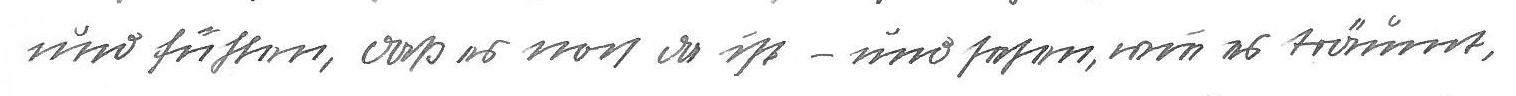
und fühlen, daß es noch da ist — und sehen, wie es träumt,
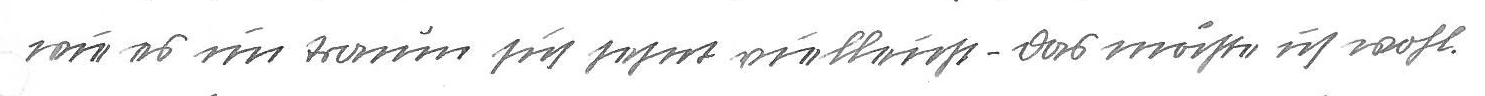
wie es im Traum sich sehnt vielleicht – das möchte ich wohl.
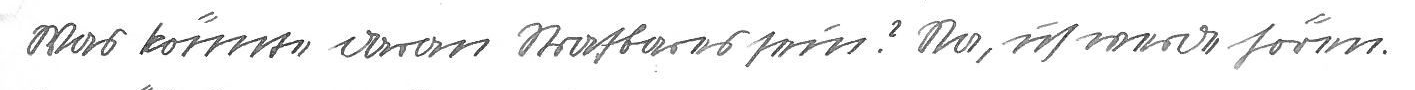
Was könnte daran Strafbares sein? Na, ich werde hören.
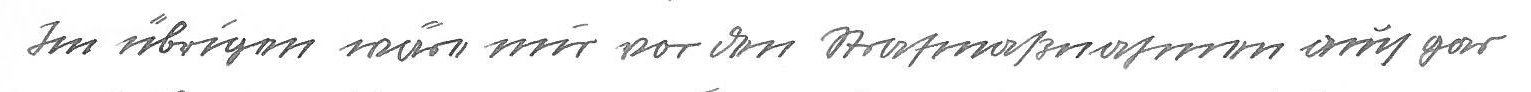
Im übrigen wäre mir vor den Strafmaßnahmen auch gar
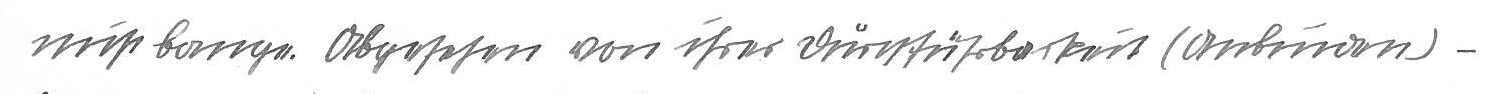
nicht bange. Abgesehen von ihrer Durchführbarkeit (Anbinden) –
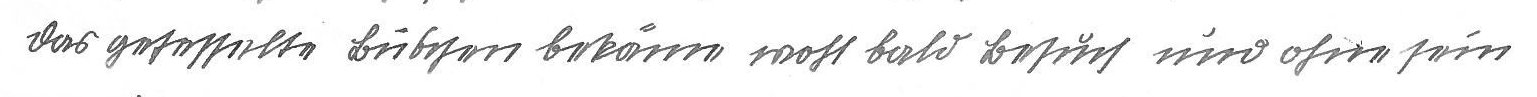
das gefesselte Bübchen bekäme wohl bald Besuch und ohne sein
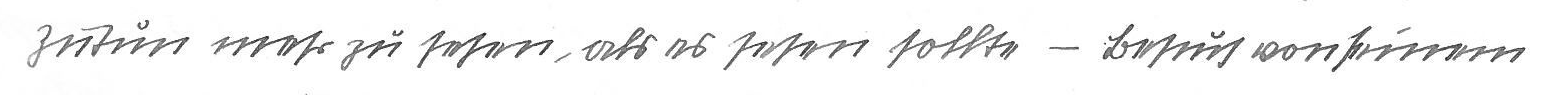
Zutun mehr zu sehen, als es sehen sollte — Besuch von seinem
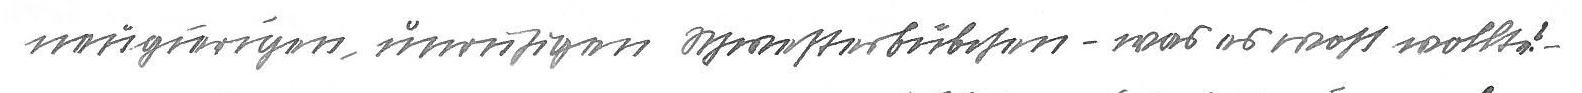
neugierigen, unruhigen Schwesterbübchen – was es wohl wollte? –
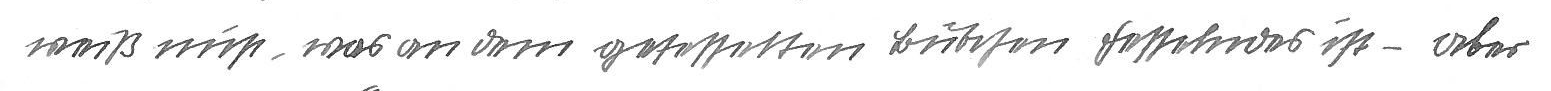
weiß nicht, was an dem gefesselten Bübchen Fesselndes ist – aber
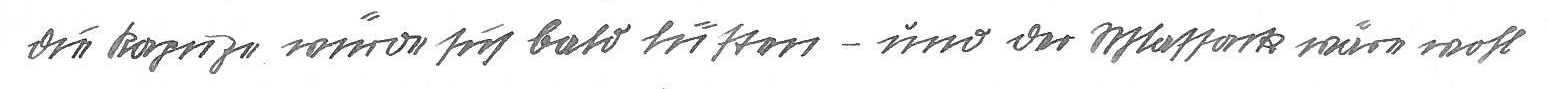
die Kapuze würde sich bald lüften – und der Schlafsack wäre wohl
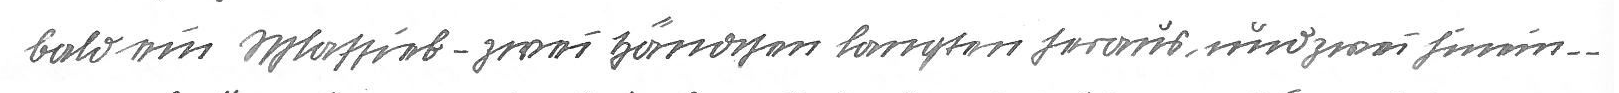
bald ein Schlafsieb – zwei Händchen langten heraus, und zwei hinein – –
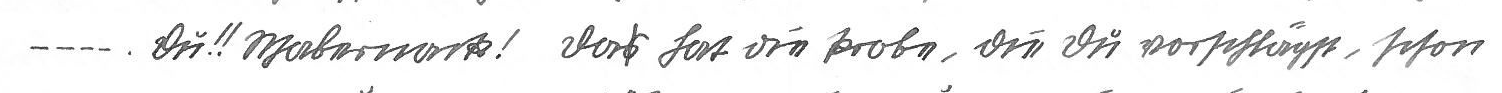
– – – – . Du!! Schabernack! Das hat die Probe, die Du vorschlägst, schon
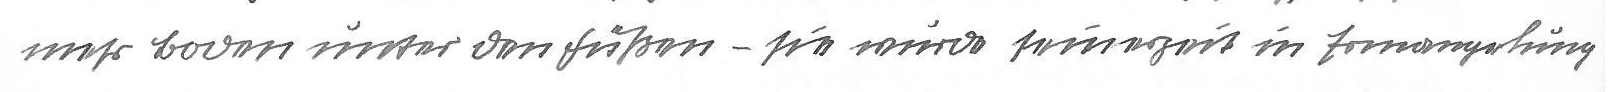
mehr Boden unter den Füßen – sie wurde seinerzeit in Ermanglung
